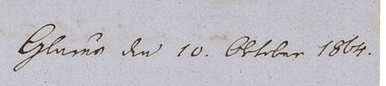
Glarus den 10. Oktober 1864.
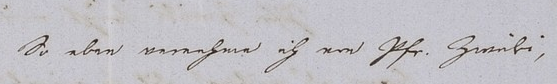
So eben vernehme ich von Pfr. Zwicki,
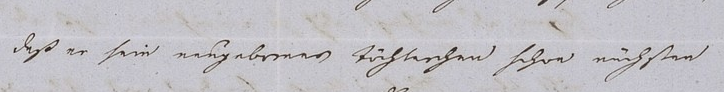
daß er sein neugebornes Töchterchen schon nächsten
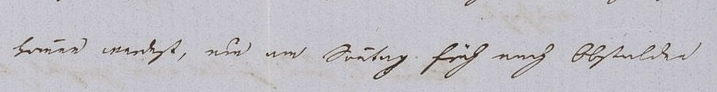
kommen werdest, um am Sonntag früh nach Obstalden
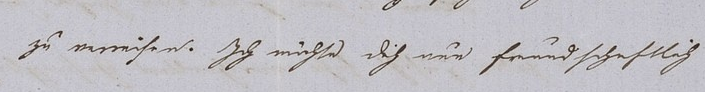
zu verreisen. Ich möchte Dich nun freundschaftlich
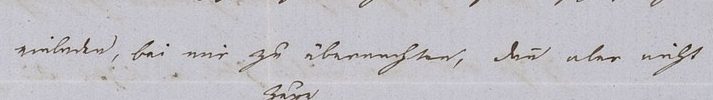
einladen, bei uns zu übernachten, dann aber nicht
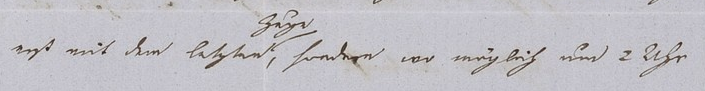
erst mit dem letzten Zuge, sondern wo möglich um 2 Uhr
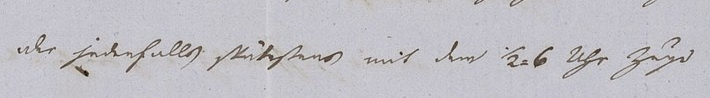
oder jedenfalls spätestens mit den ½6 Uhr Zuge
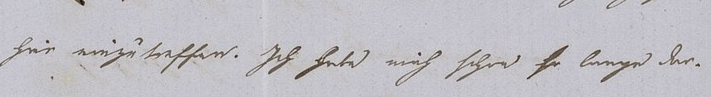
hier einzutreffen. Ich habe mich schon so lange dar-
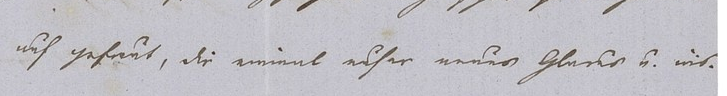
auf gefreut, Dir einmal unser neues Glarus u. ins-
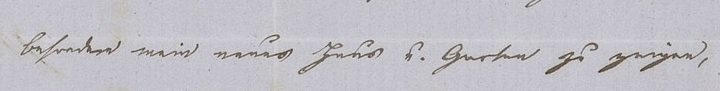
besondere mein neues Haus u. Garten zu zeigen,
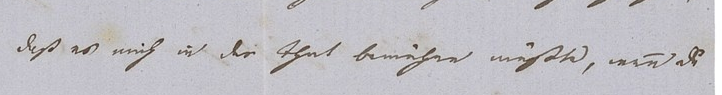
daß es mich in der That bemühen müßte, wenn Du
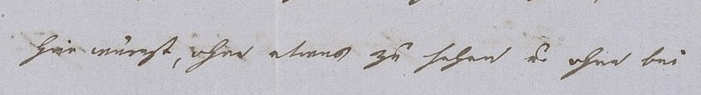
hier wärest, ohne etwas zu sehen u. ohne bei
